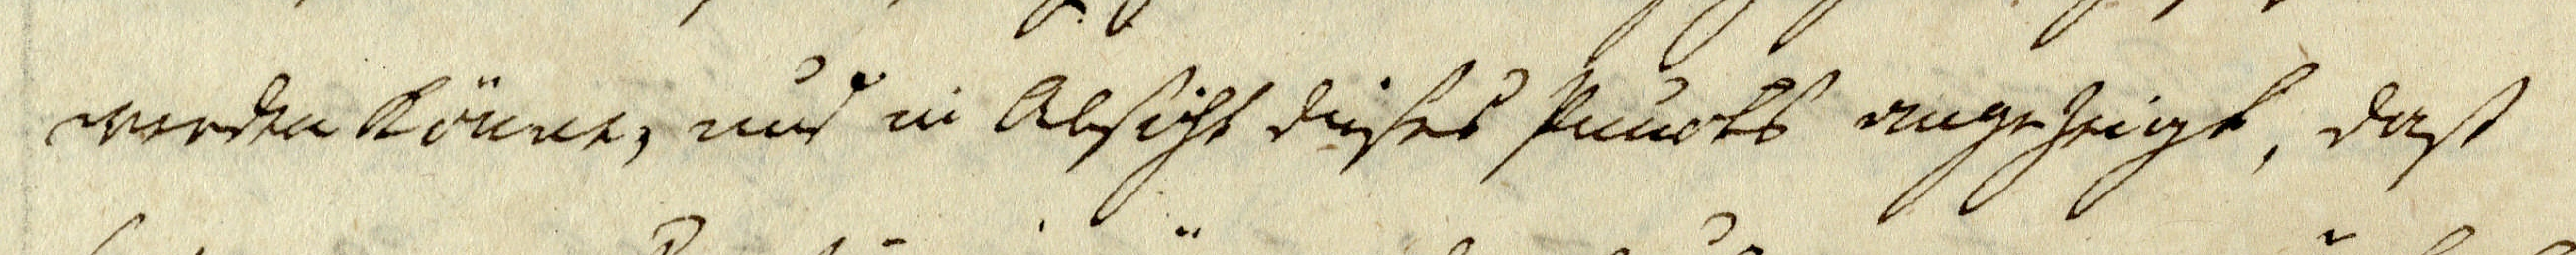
werden könne, und in Absicht dieses Puncts angezeigt, daß
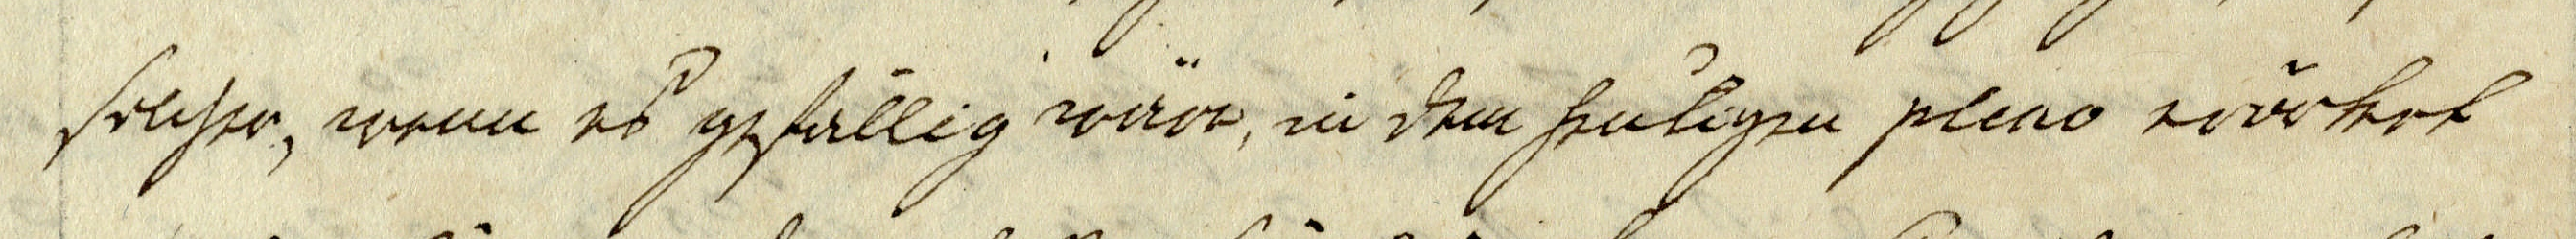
solcher, wenn es gefällig wäre, in dem heutigen pleno erörtert
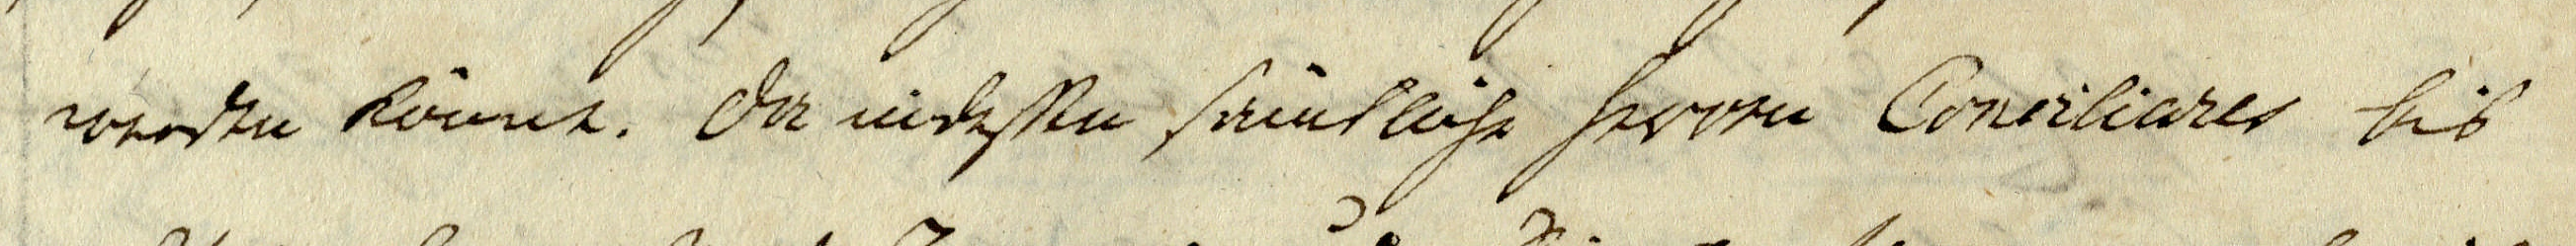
werden könne. Da indessen sämtliche Herren Conciliares bis
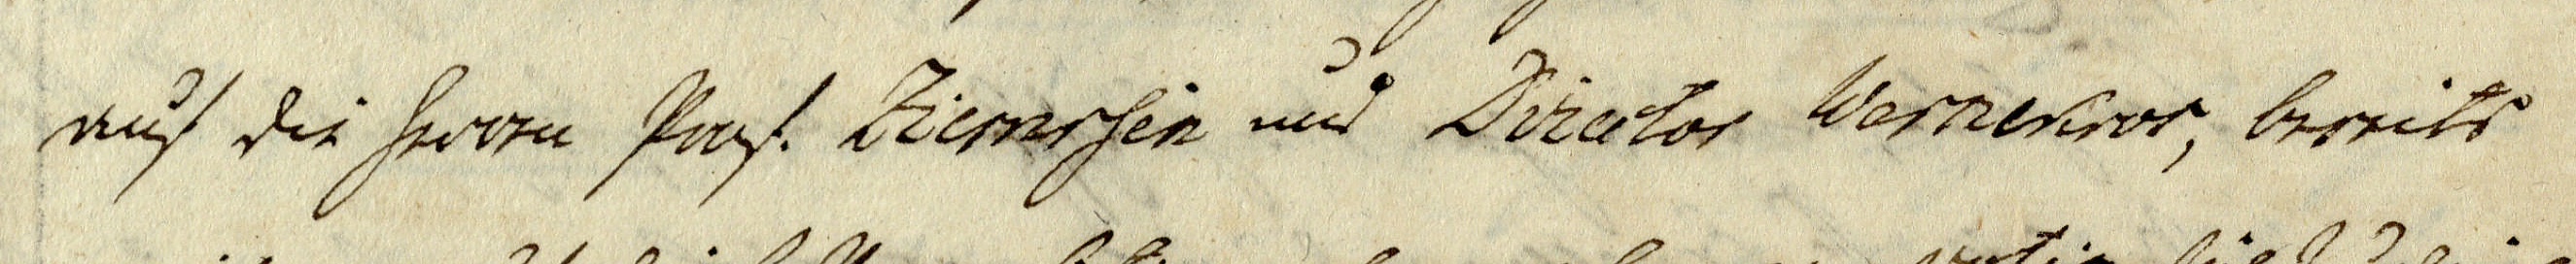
auf die Herren Prof. Ziemssen und Director Warnekros, bereits
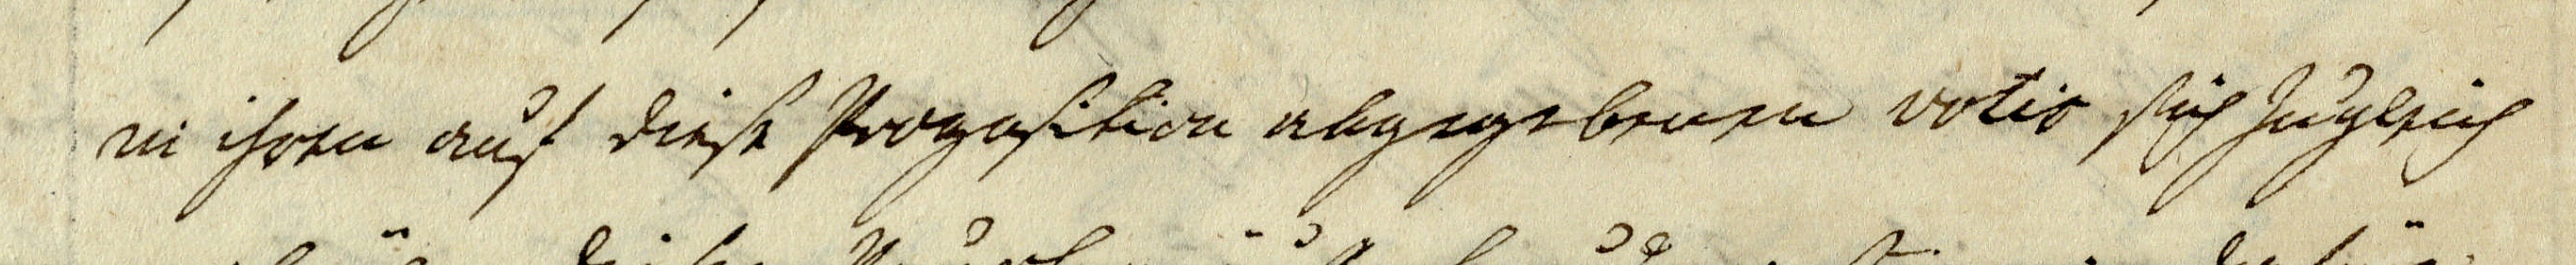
in ihren auf diese Proposition abgegebenen votis sich zugleich
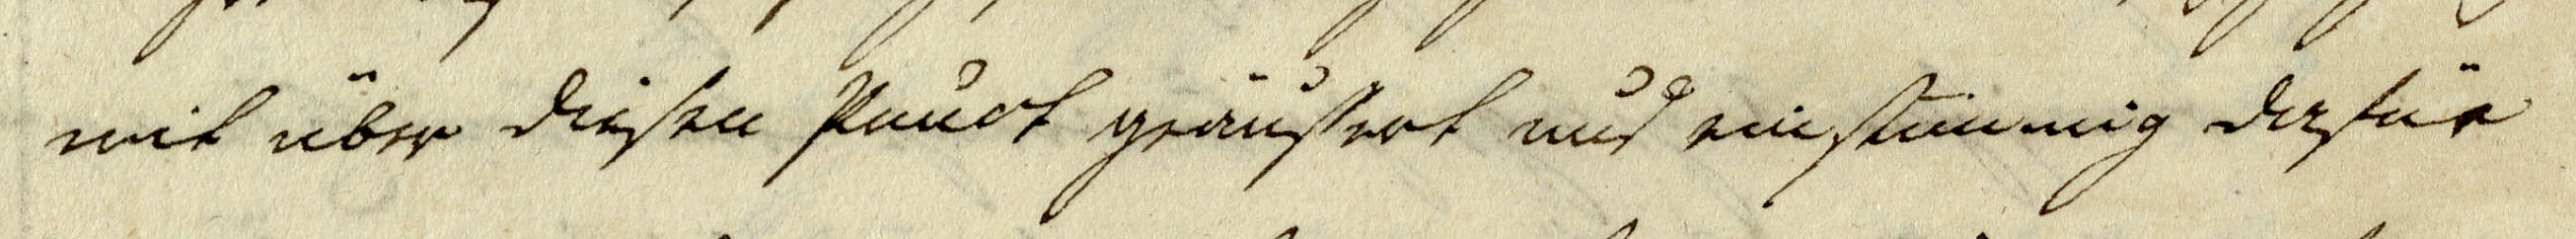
mit über diesen Punct geäussert und einstimmig dafür
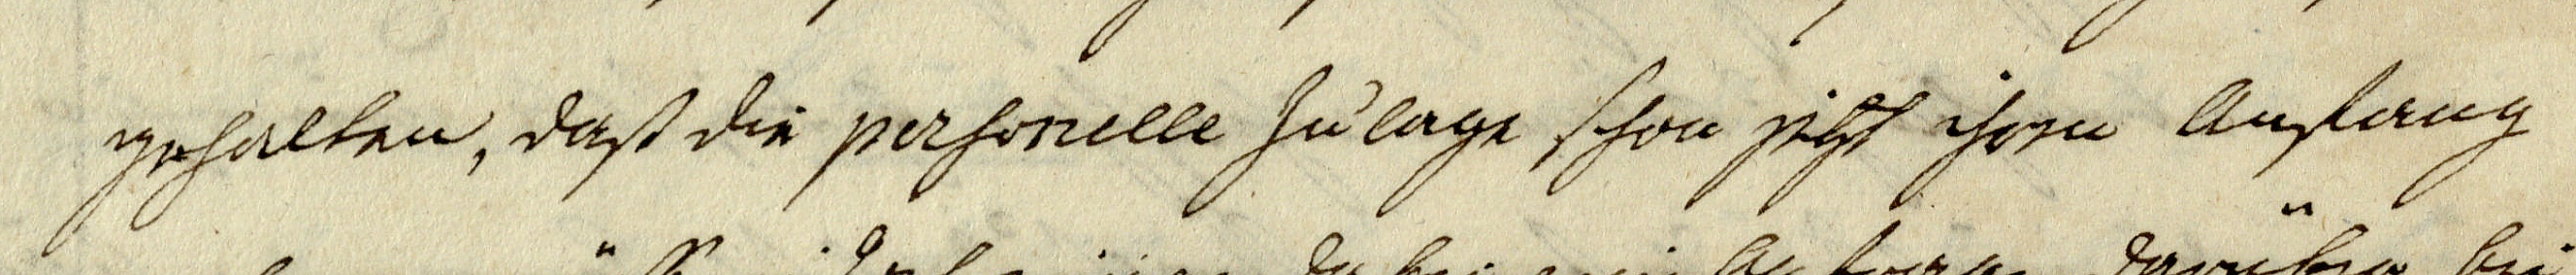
gehalten, daß die personelle Zulage schon jetzt ihren Anfang
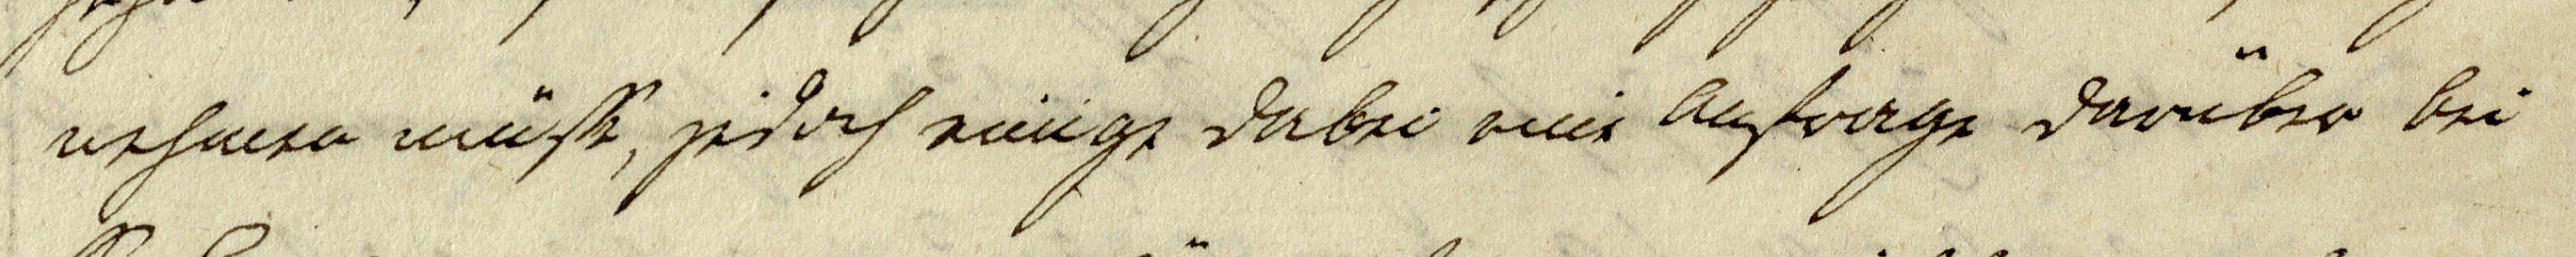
nehmen müsse, jedoch einge dabei eine Anfrage darüber bei
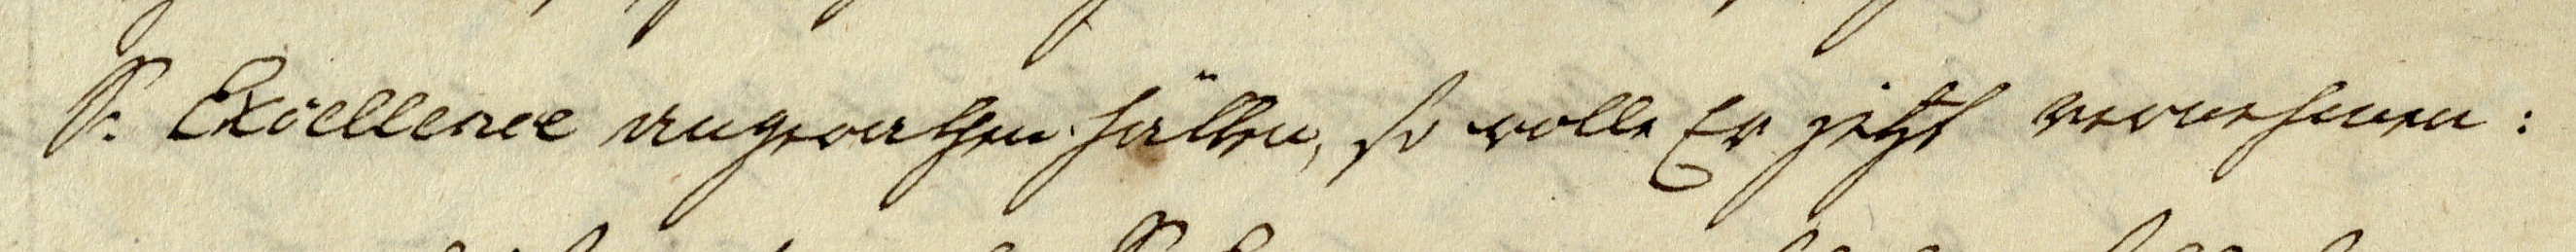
Sr. Excellence angerathen hätten, so wolle Er jetzt vernehmen:
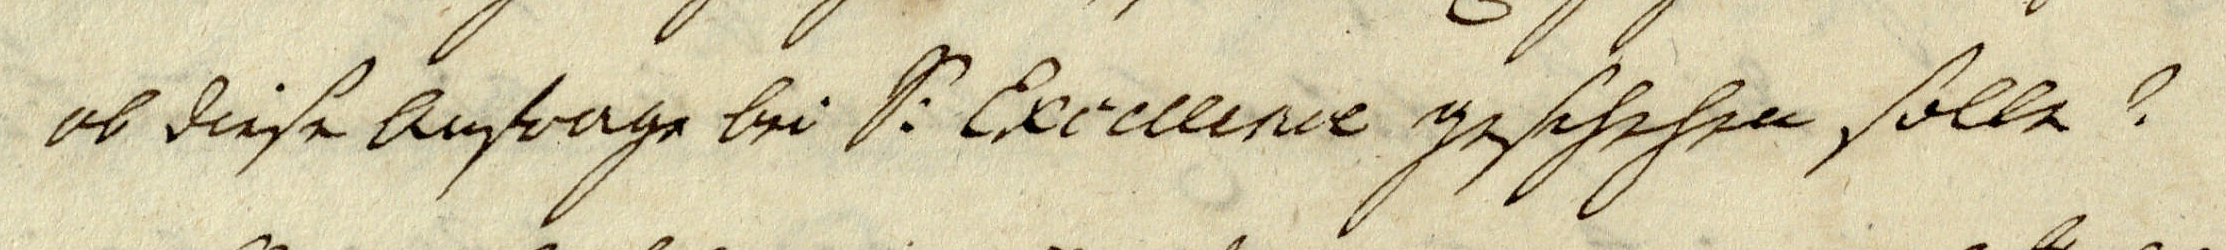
ob diese Anfrage bei Sr. Excellence geschehen solle?
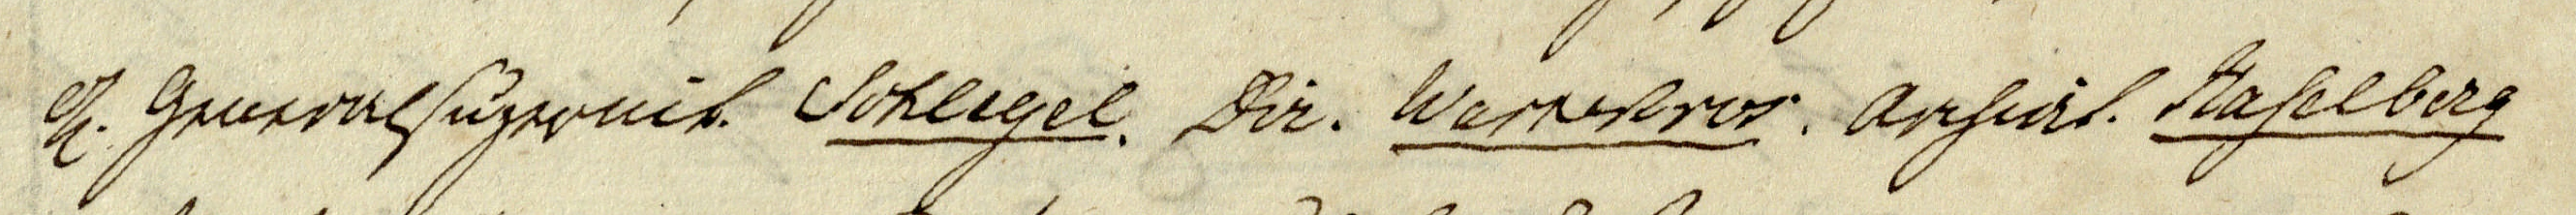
dh. Generalsuperint. Schlegel. Die. Warnekros. Archiat. Haselberg
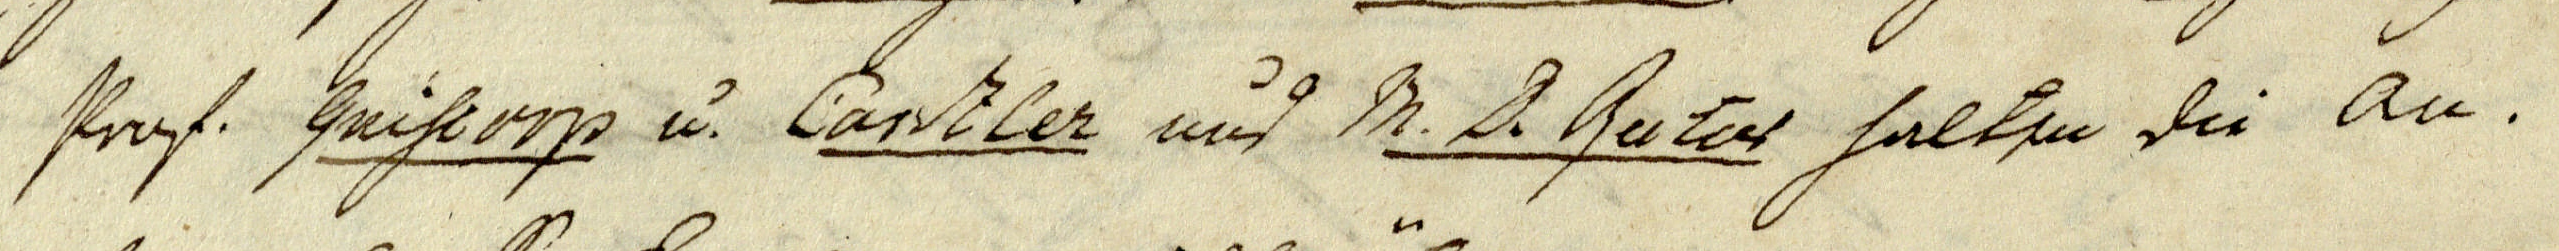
Prof. Quistorp u. Canzler und M. D. Rector halten die An¬
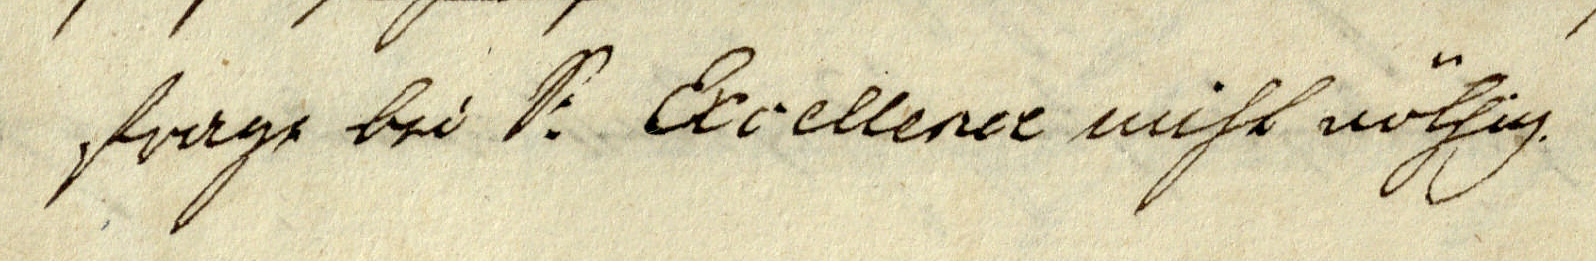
frage bei Sr. Excellence nicht nöthig.
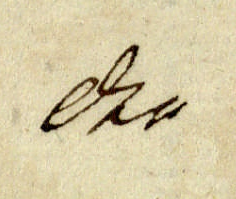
Der
